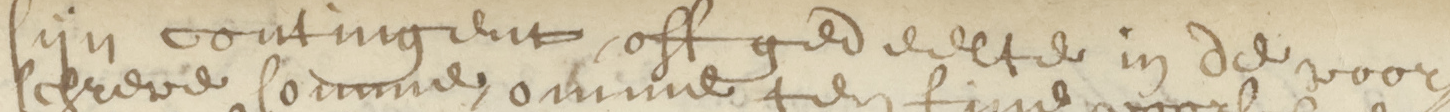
sijn contingent, oft gedeelte in de voor„
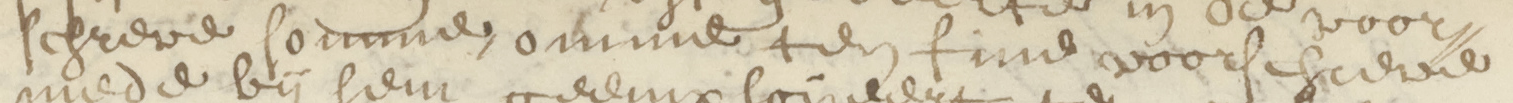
schreve somme, omme ten fine voorschreve
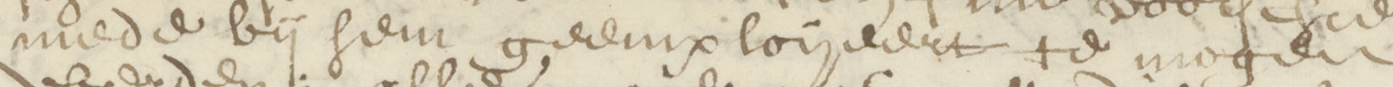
mede bij hem geemploijeert te mogen
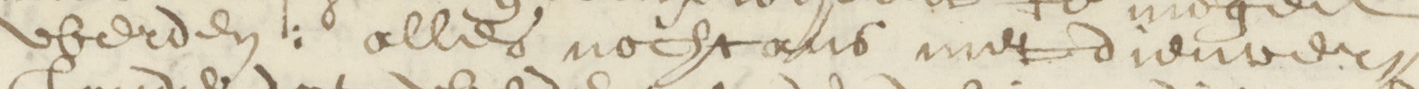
werden: alles nochtans met dienver„
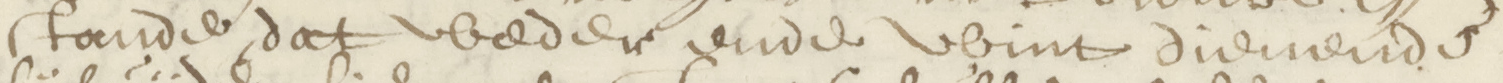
stande, dat weder ende wint dienende
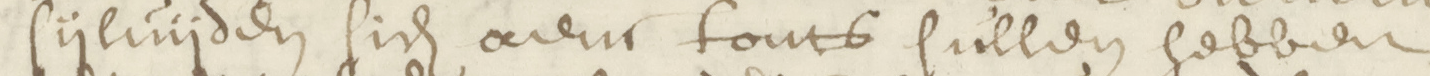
sijluijden sich aens stonts sullen hebben
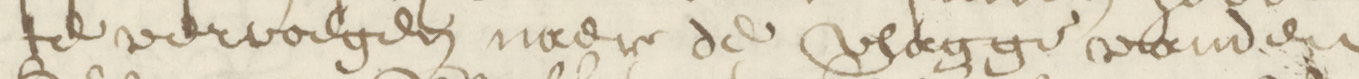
te vervoegen naer de vlagge vanden
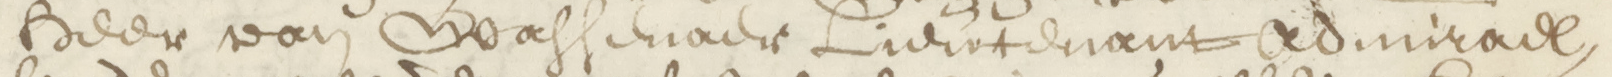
Heer van Wassenaer Lieutenant Admirael,
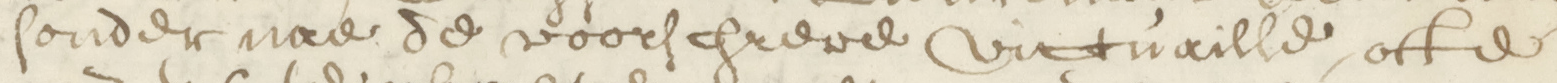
sonder nae de voorschreve victuaille, ofte
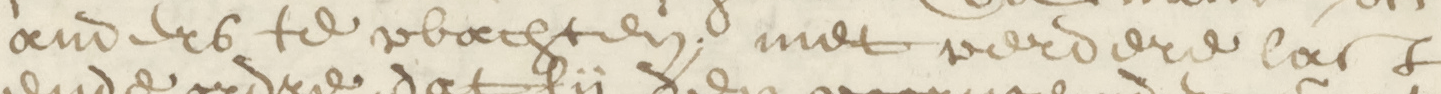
anders te wachten; met verdere last
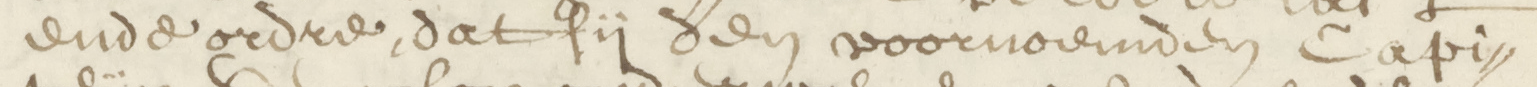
ende ordre, dat sij den voornoemden Capi„
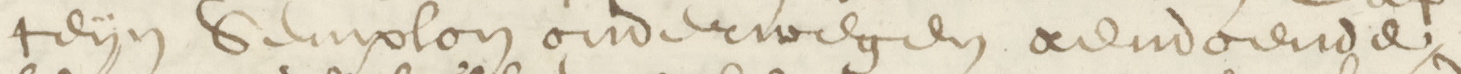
teijn Semplon onderwegen aendoende
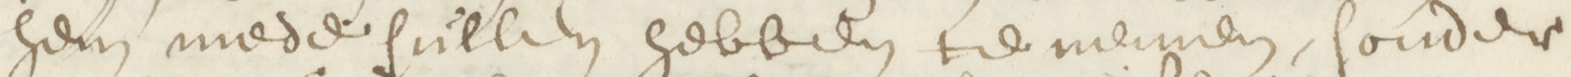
hem mede sullen hebben te nemen, sonder
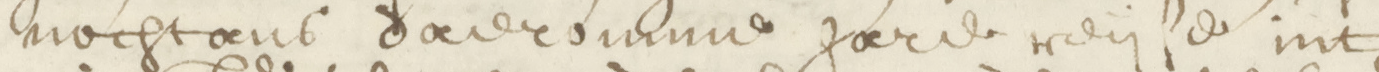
nochtans daeromme hare reijse int
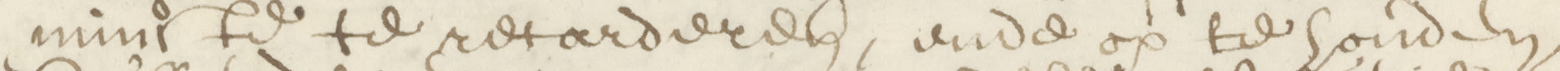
minste te retarderen, ende op te houden.
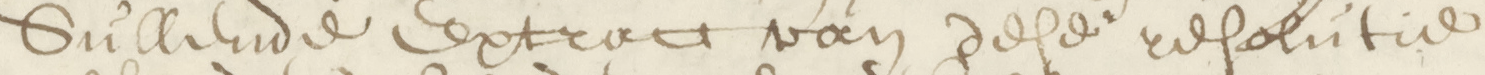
Sullende extract van dese resolutie
